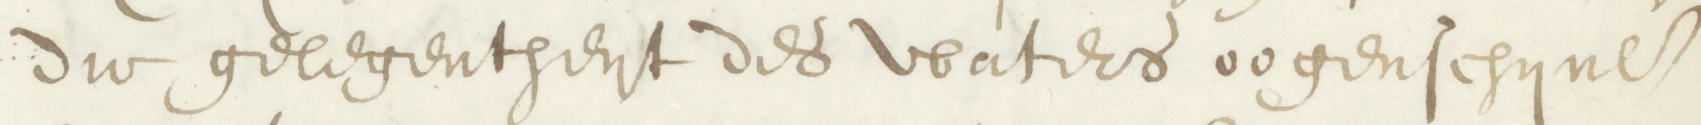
die gelegentheyt des waters oogenschynl
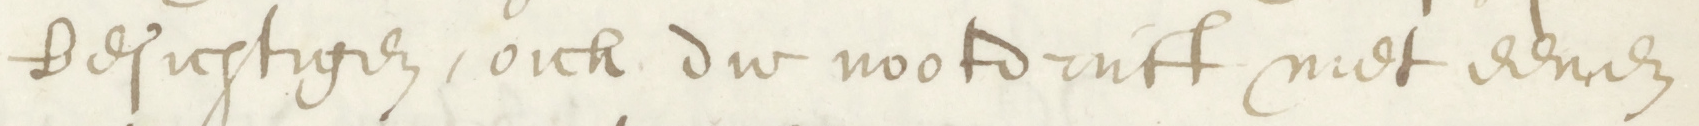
besichtigen, oick die nootdruft met eenen
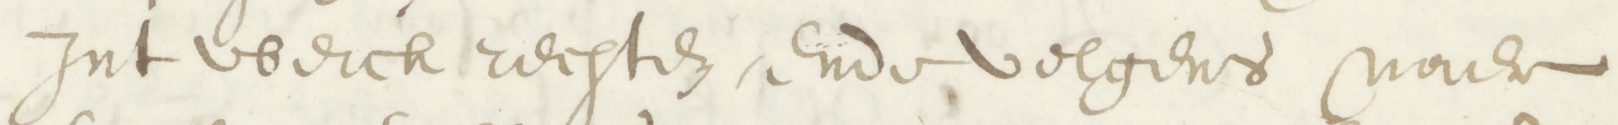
Int werck rechten, ende volgens naer
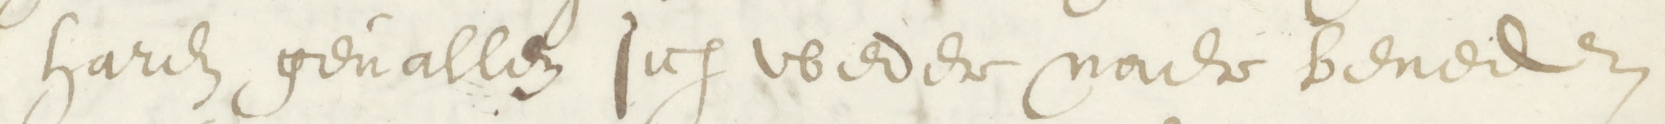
haren geuallen sich weder naer beneden
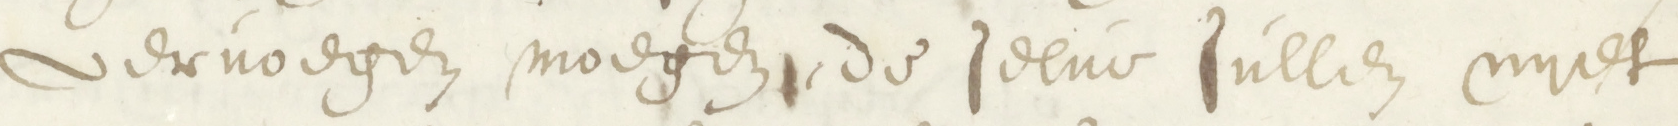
veruoegen moegen, de selue sullen nyet
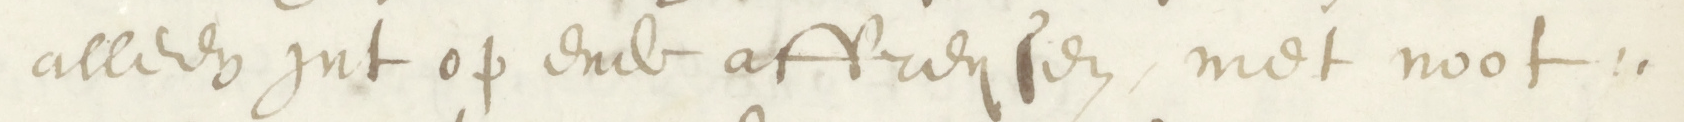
alleen Int op ende affreysen, met noot„
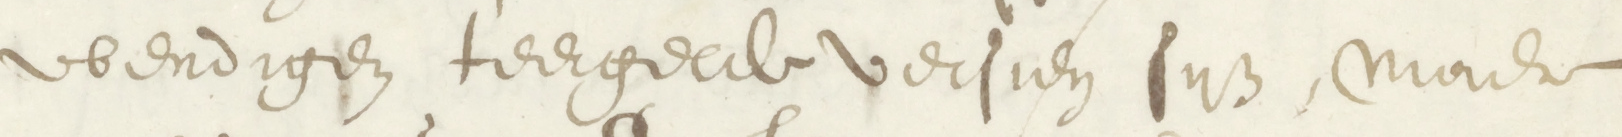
wendigen teergelde versien syn, maer
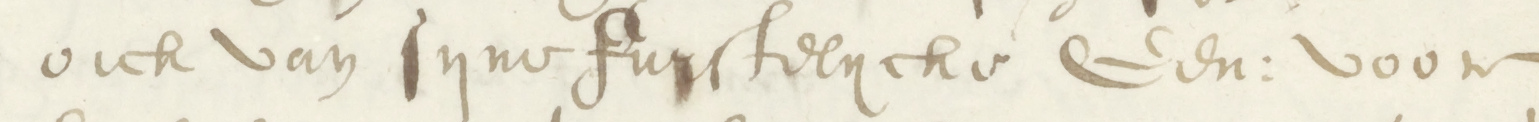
oick van syne furstelycke Gen: voor
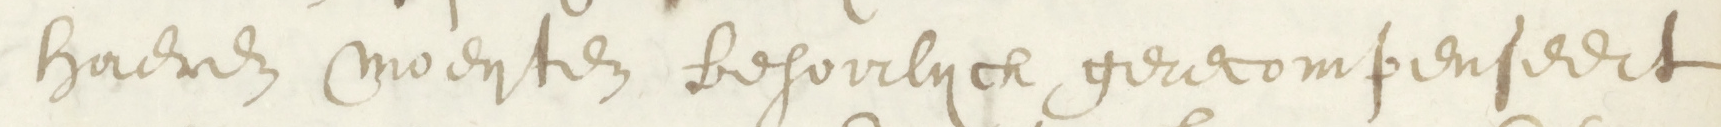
haeren moeyten behoirlyck gerecompenseert
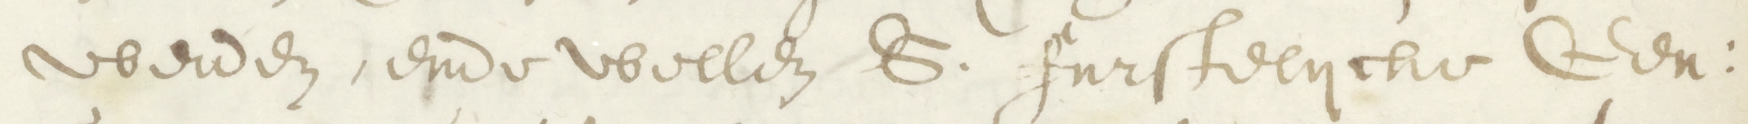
werden, ende wellen S. furstelycke Gen:
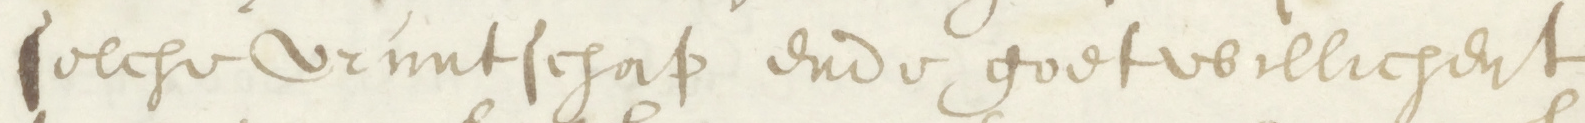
solche vruntschap ende goetwillicheyt
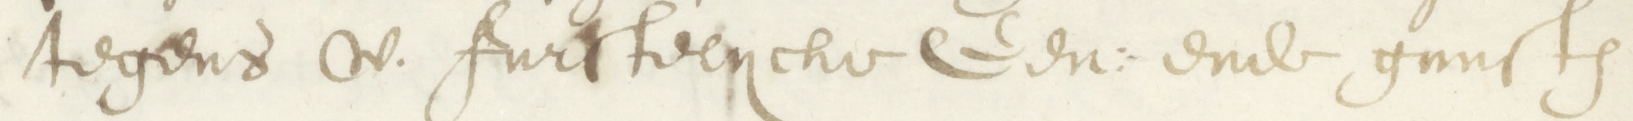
tegens U. furstelycke Gen: ende gunsth
